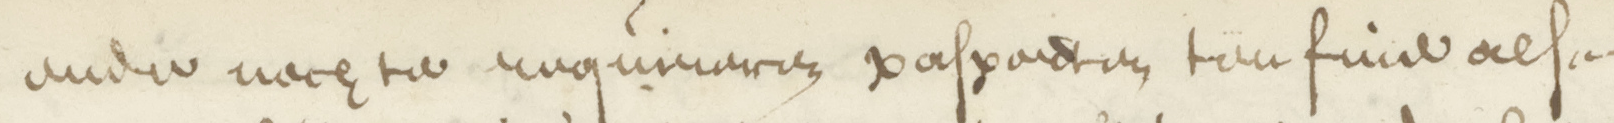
ende noch te requireren pasporten ten fine alse
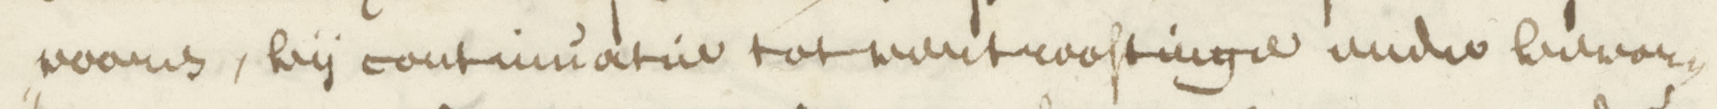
vooren, bij continuatie tot vertroostinge ende bevor,,
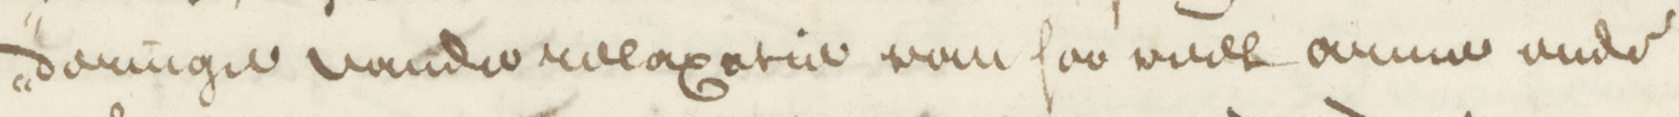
„deringe vande relaxatie van soo veel arme ende
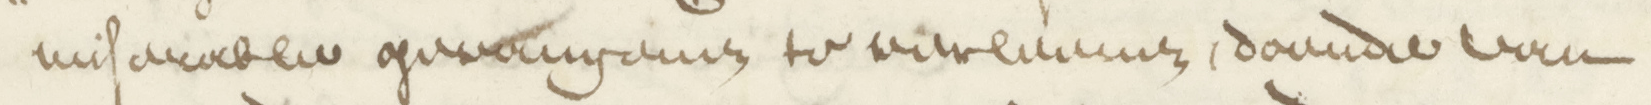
miserable gevangenen te verleenen, doende van
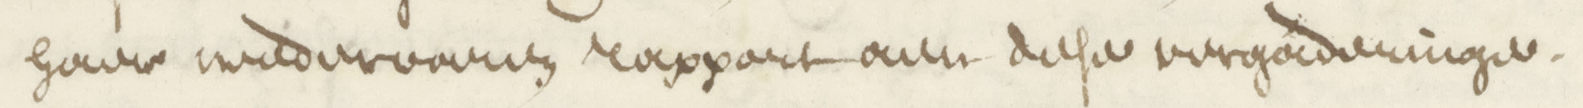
haer wedervaren rapport aen dese vergaderinge.
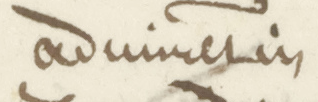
admirlt in
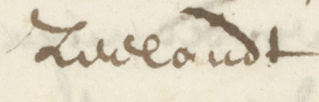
Zeelandt
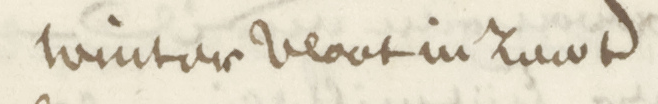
winter vloot in zee te
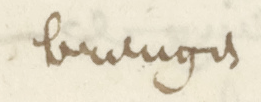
brengen
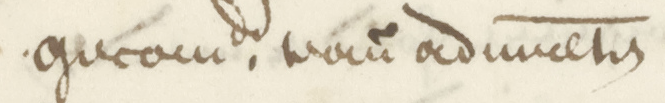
gecomden. van admrlten
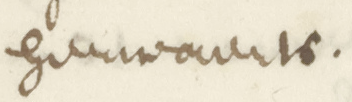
herwaerts.
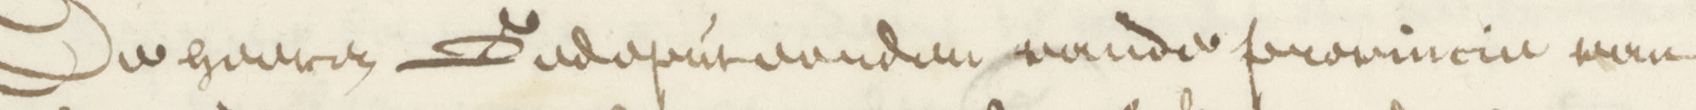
De heeren Gedeputeerden vande provincie van
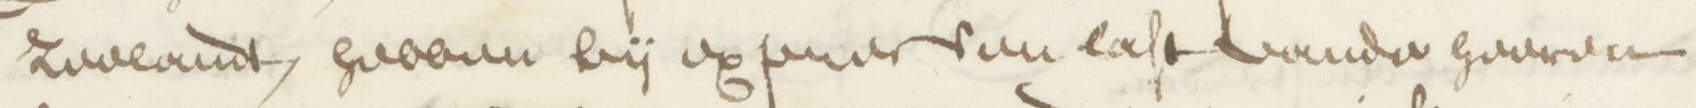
Zeelandt, hebben bij expressen last vande heeren
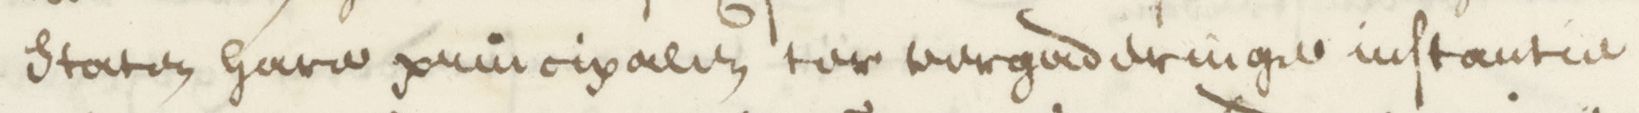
Staten hare principalen ter vergaderinge instantie
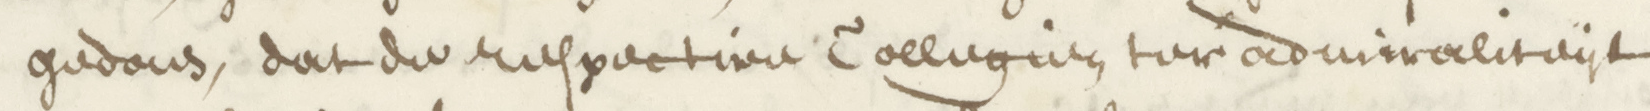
gedaen, dat de respective Collegien ter admiraliteijt
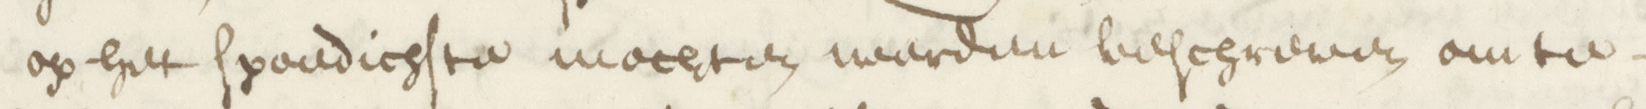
op het spoedichste mochten werden beschreven om te -
